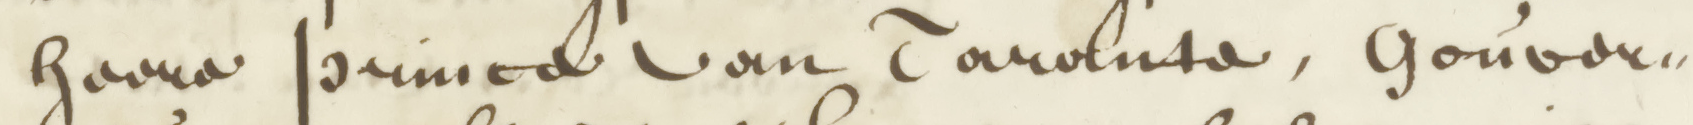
heere Prince van Tarente, Gouver„
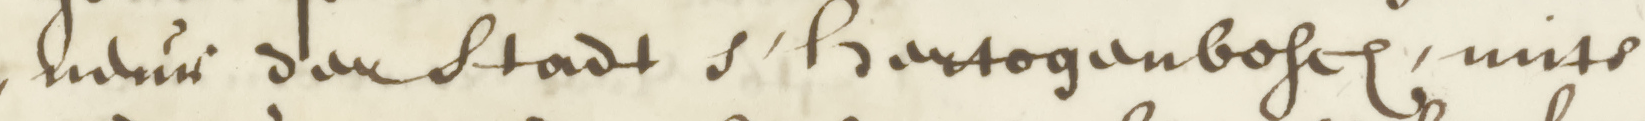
,,neur der Stadt s' Hertogenbosch, mits
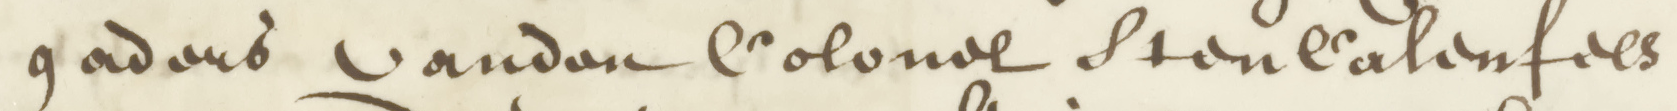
gaders vanden Colonel StenCalenfels
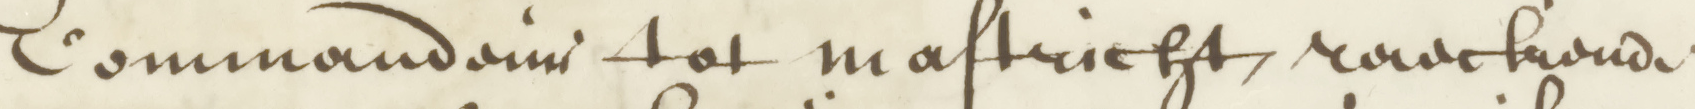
Commandeur tot mastricht, raeckende
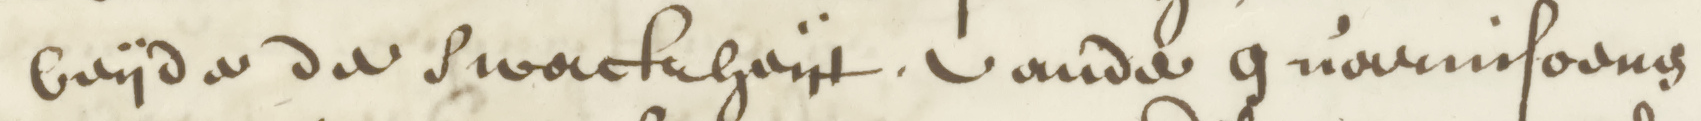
beijde de Swackheijt, vande guarnisoenen
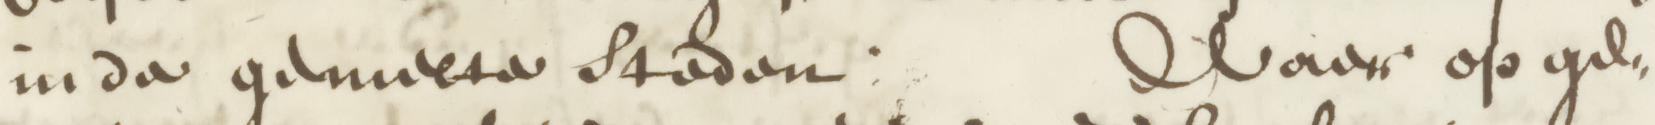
in de gemelte Steden: Waer op ge„
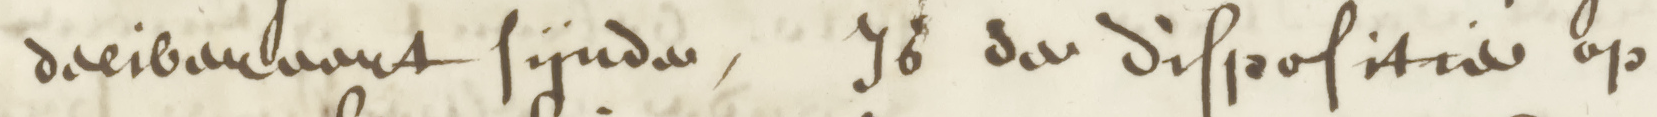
delibereert sijnde, Is de dispositie op
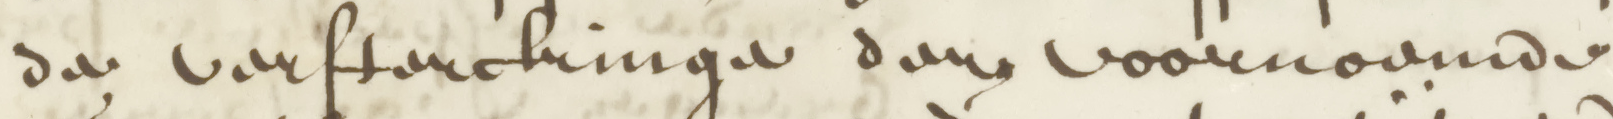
de versterckinge der voornoemde
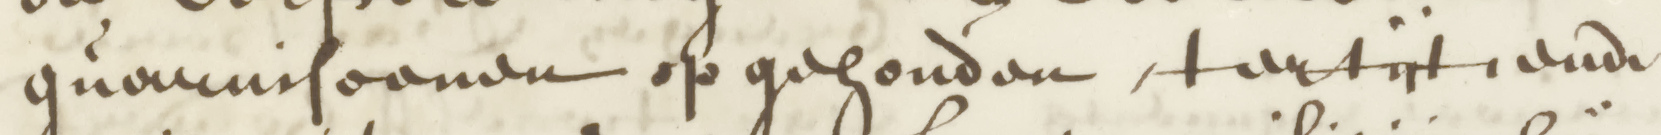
guarnisoenen op gehouden, tertijt ende
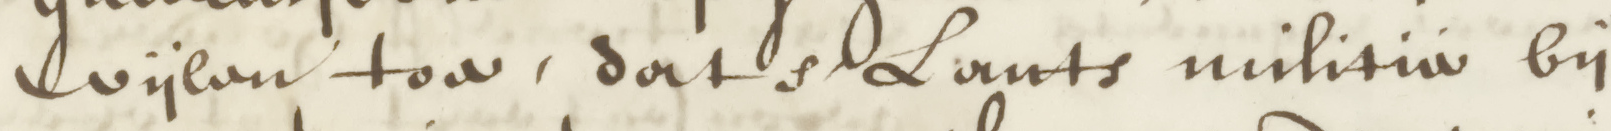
wijlen toe, dat s' Lants militie bij
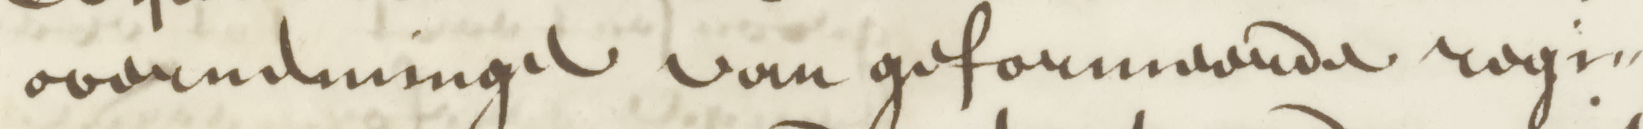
overneminge van geformeerde regi„
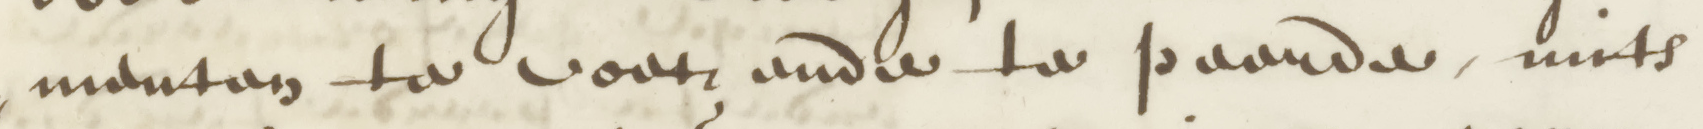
,,menten te voet, ende te peerde, mits
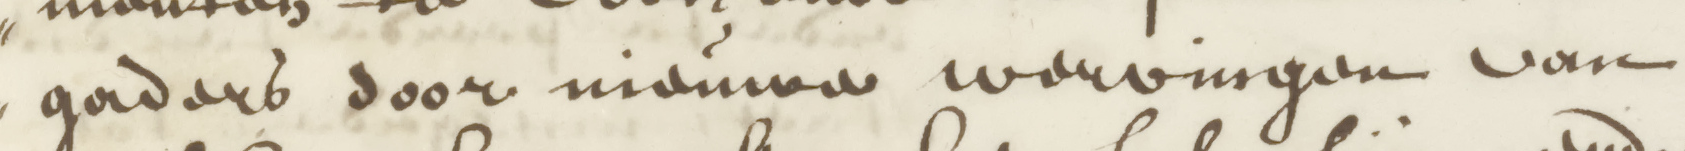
gaders door nieuwe wervingen van
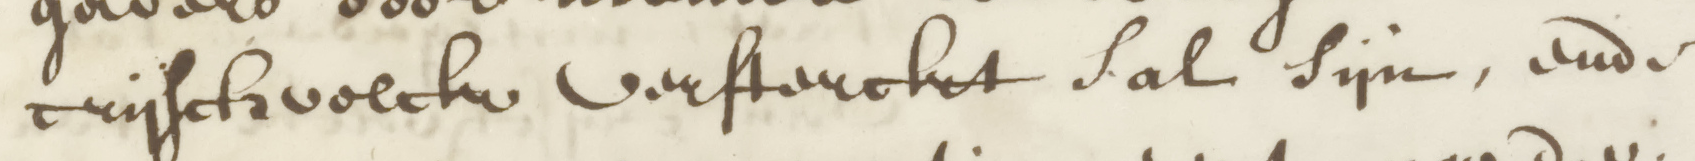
crijschvolck versterckt sal sijn, ende
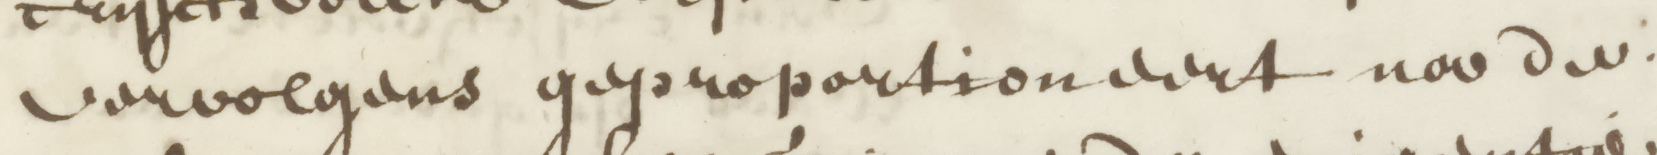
vervolgens geproportioneert na de
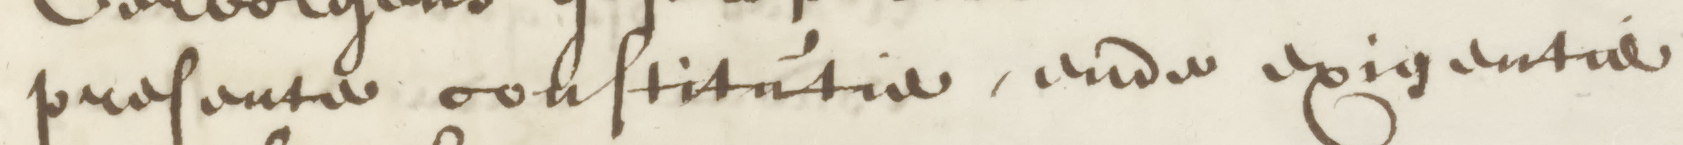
presente constitutie, ende exigentie
